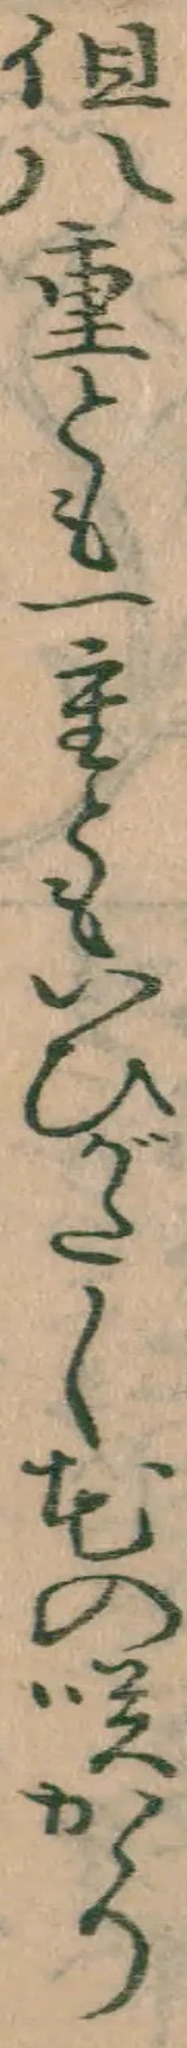但八重とも一重ともいひがたし花の咲かゝり
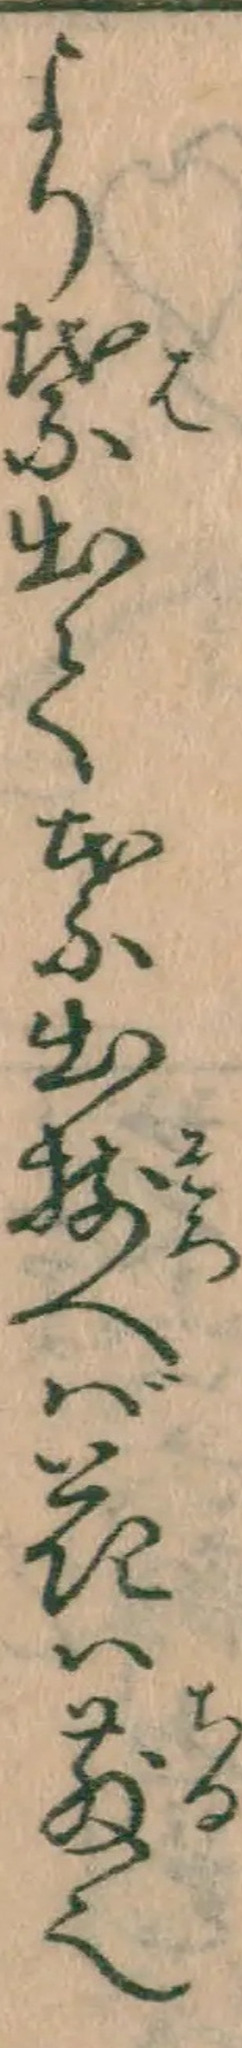より葉出て葉出揃へば花は散也
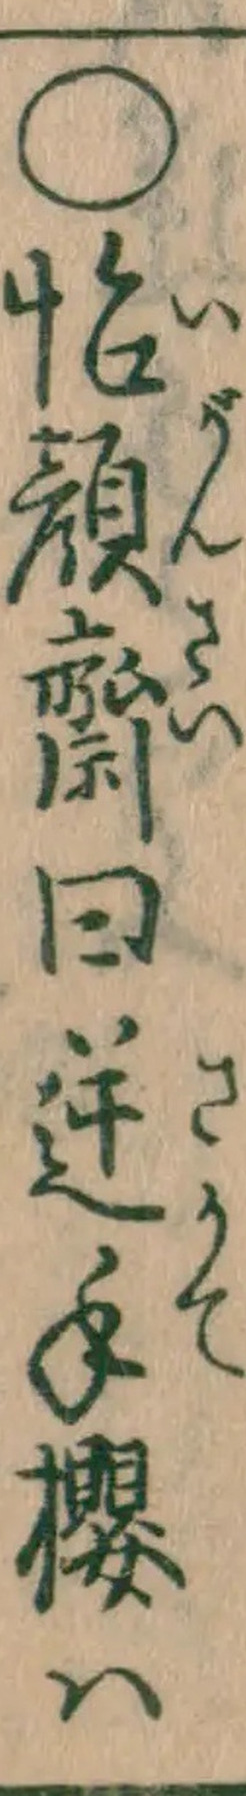○怡顔斎曰逆手桜は
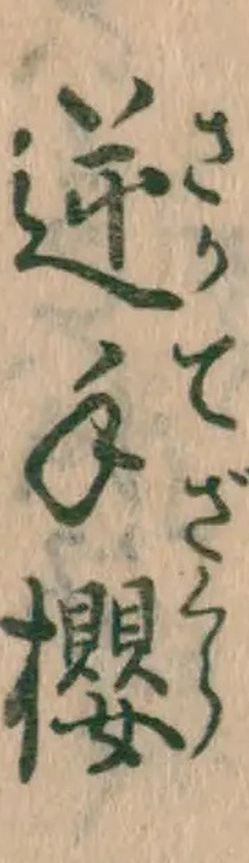逆手桜
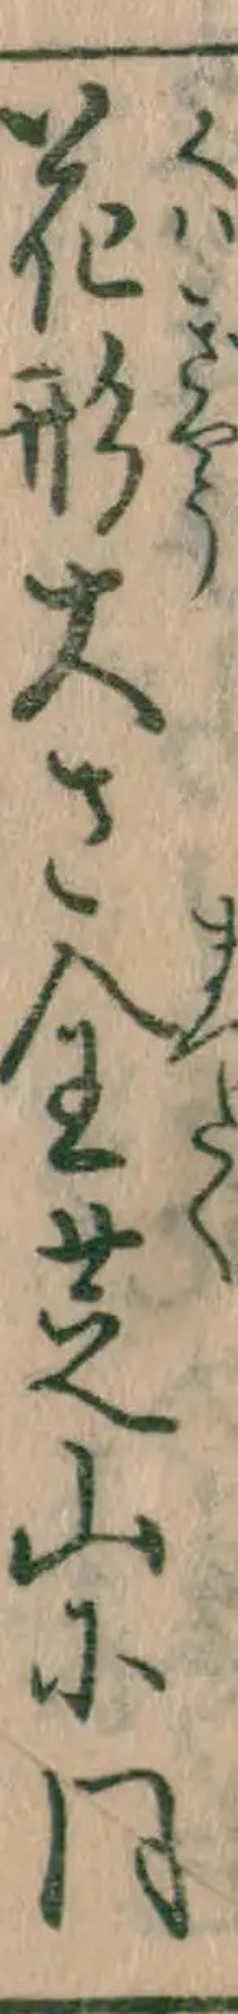花形大さ全芝山に同
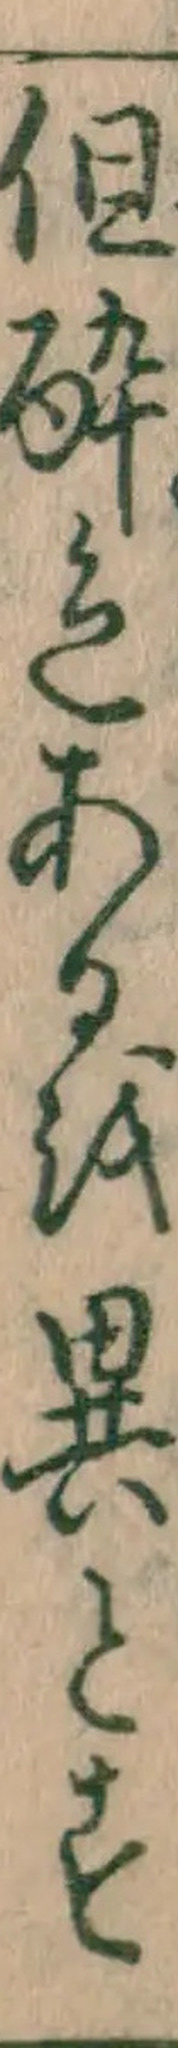但酔色あるを異とす
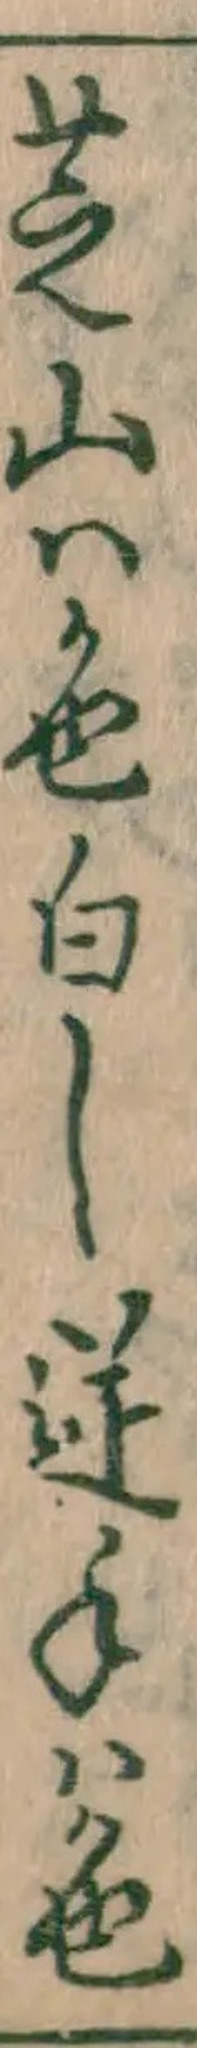芝山は色白し逆手は色
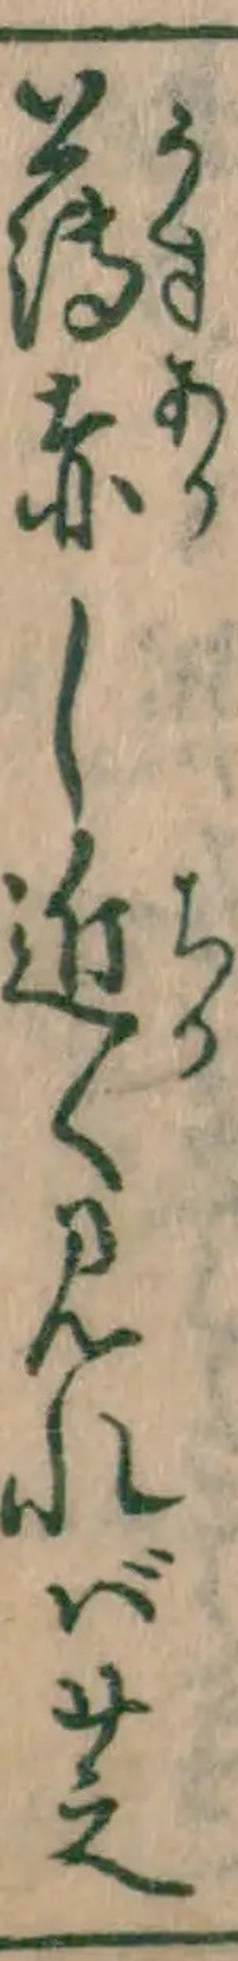薄赤し近く見れば芝
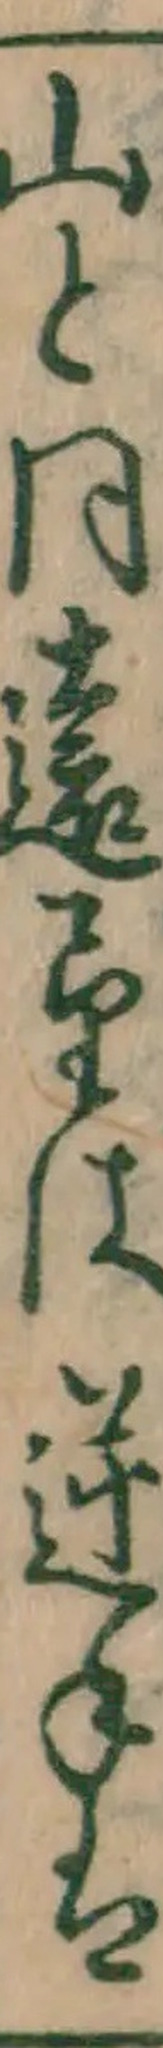山と同遠望は逆手は

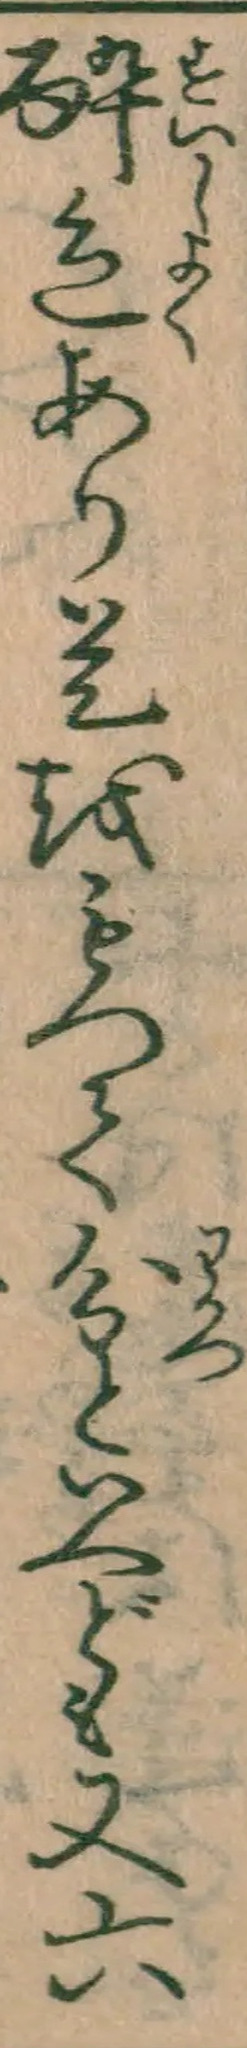酔色あり是をもつて分といへども又六
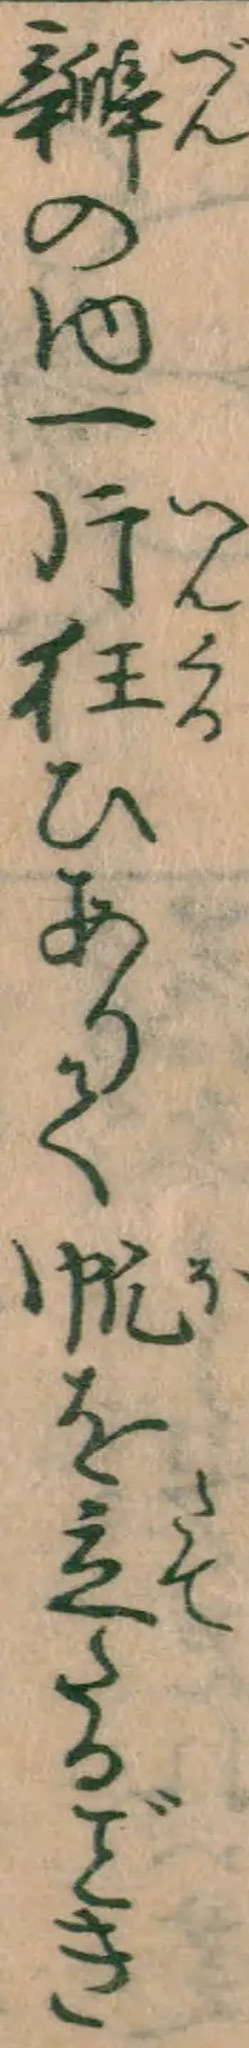弁の内一片狂ひありて帆を立たるごとき
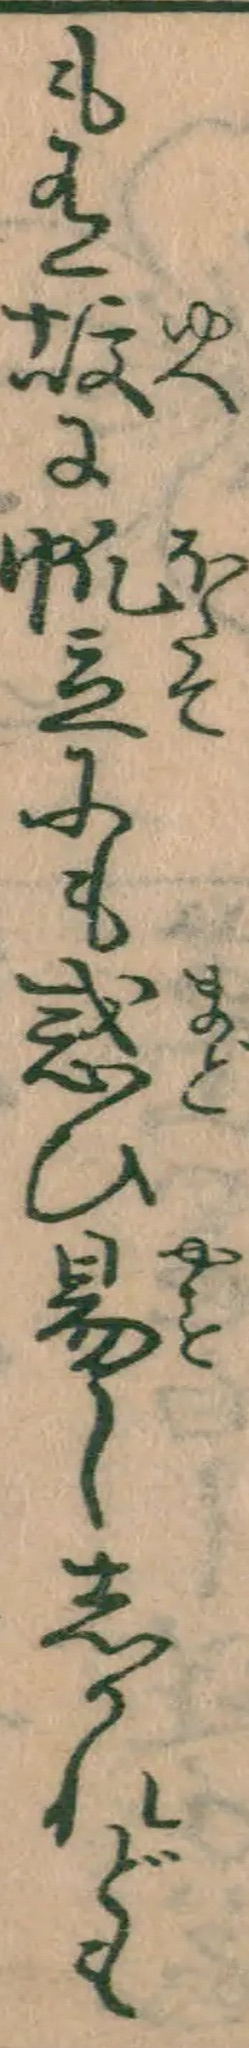も有故に帆立にも惑ひ易ししかれども
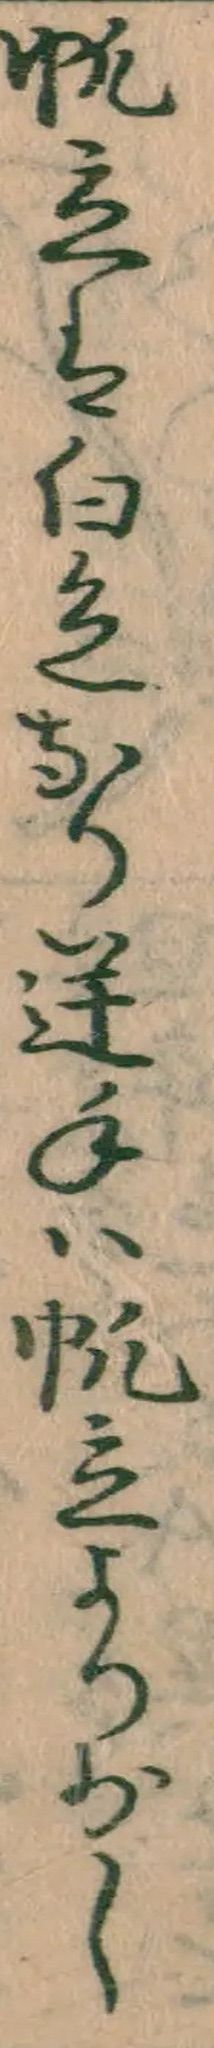帆立は白色なり逆手は帆立より少し
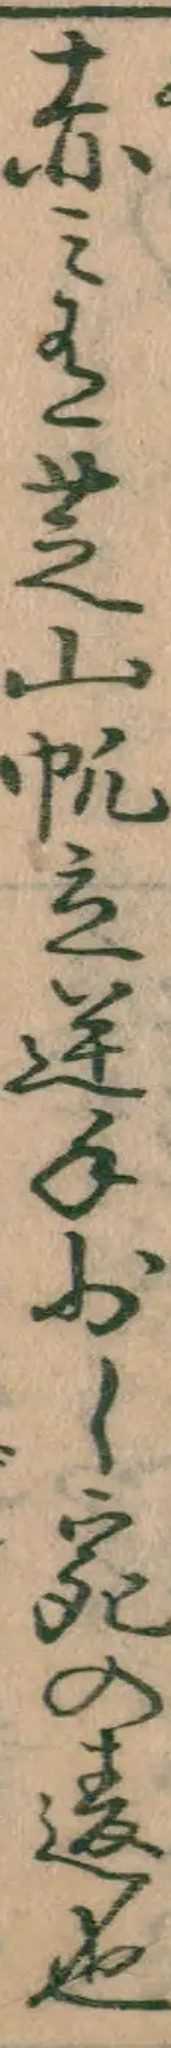赤み有芝山帆立逆手少し宛の違也
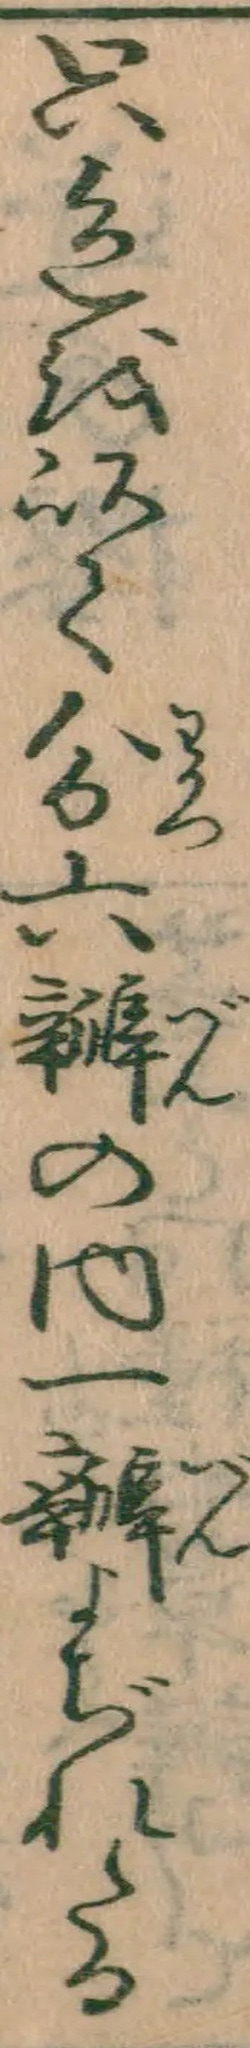只色を似て分六弁の内一弁よぢれたる
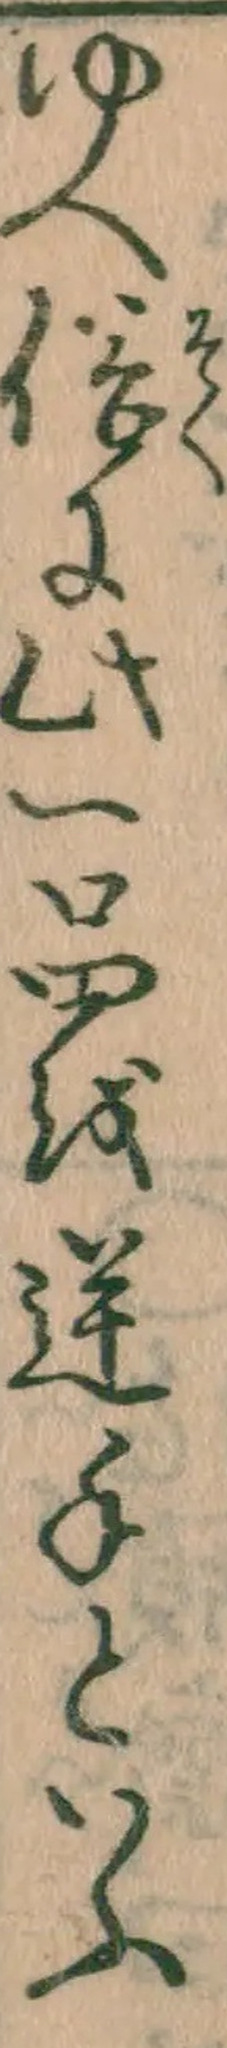ゆへ俗に此一品を逆手といふ
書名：怡顔齋櫻品
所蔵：国立国会図書館 National Diet Library, JAPAN
